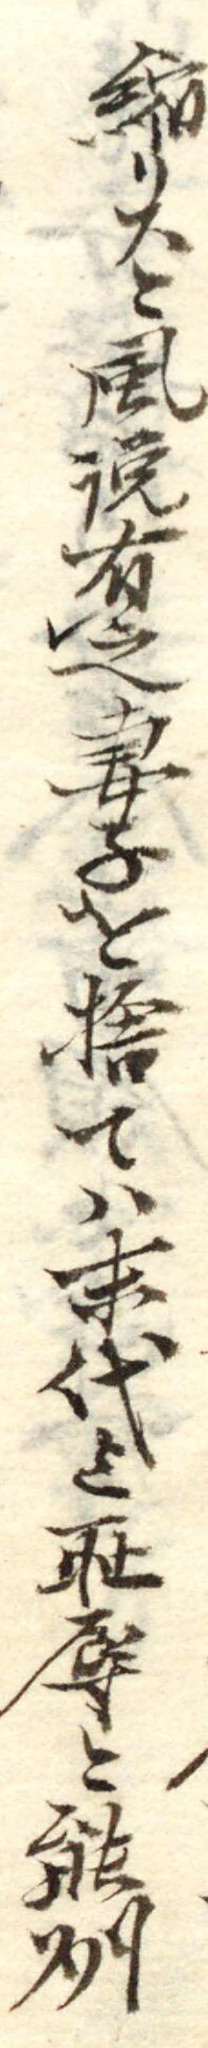縮りすと風説有之妻子を捨ては末代迄恥辱と能州
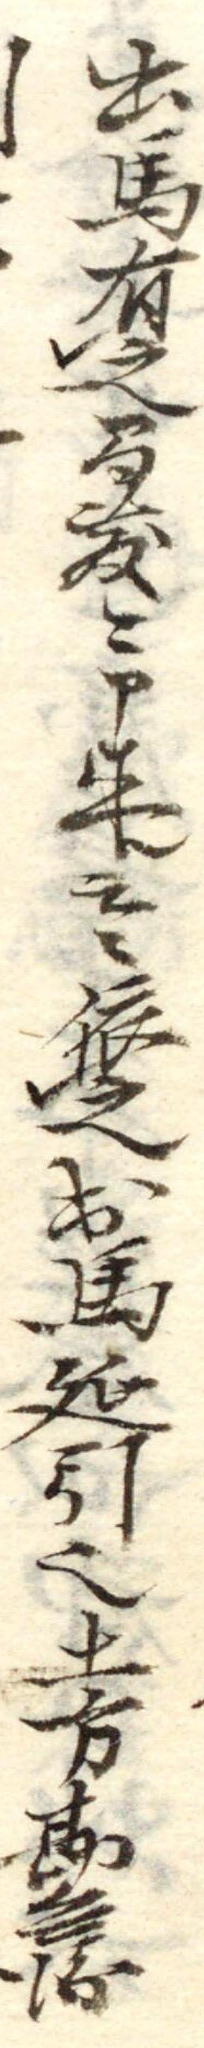出馬有之間敷と申来る云々依之出馬延引也土方勘兵衛
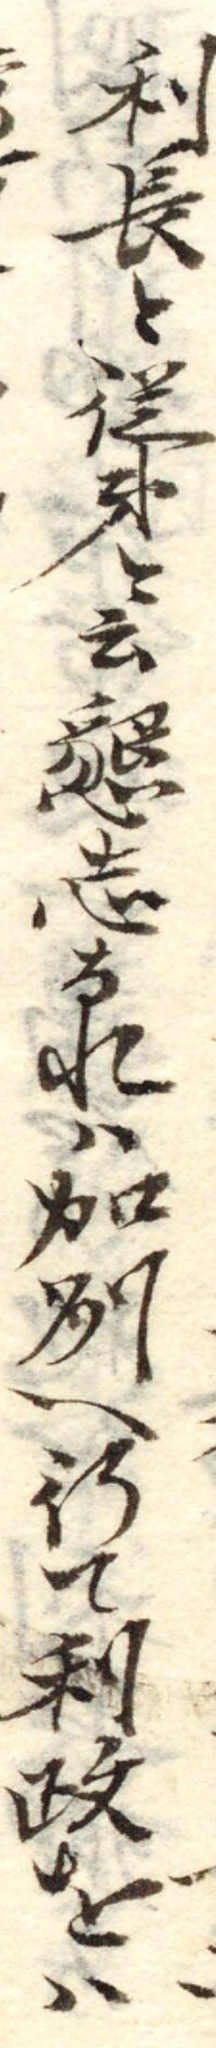利長と従弟と云懇志なれは加州へ行て利政をは
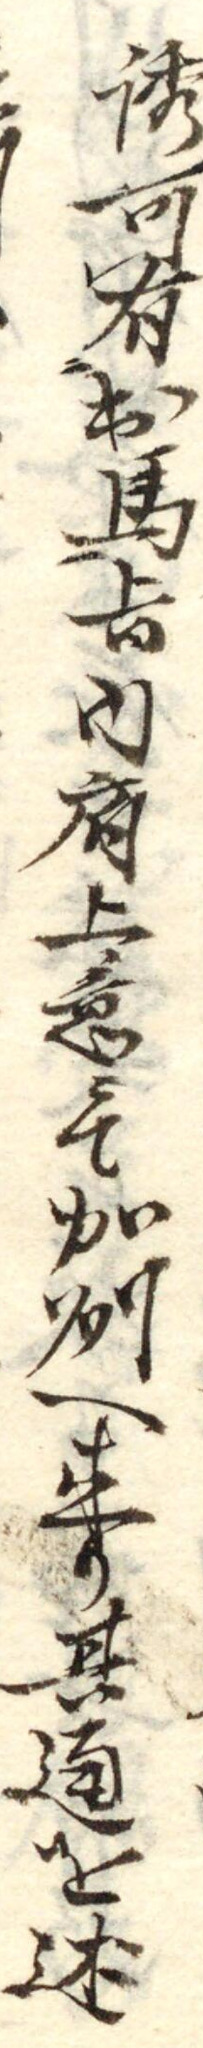誘可有出馬旨府上意にて加州へ来り其通を述
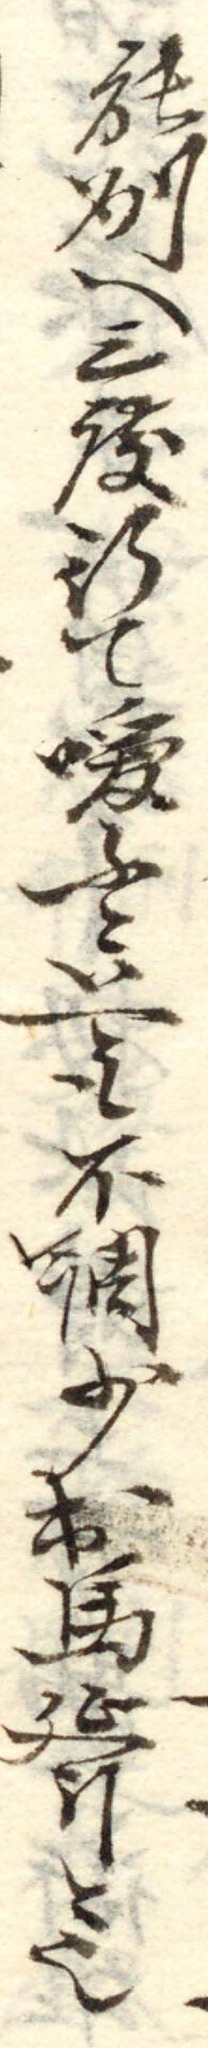能州へ三度行て噯ふといへとも不調少出馬延引と也
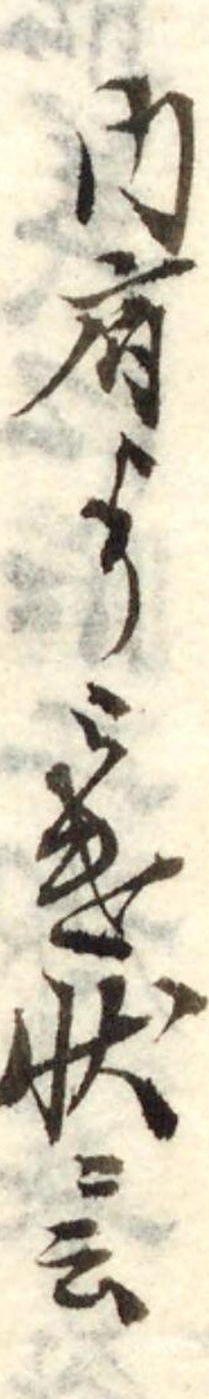内府より被遣状に云
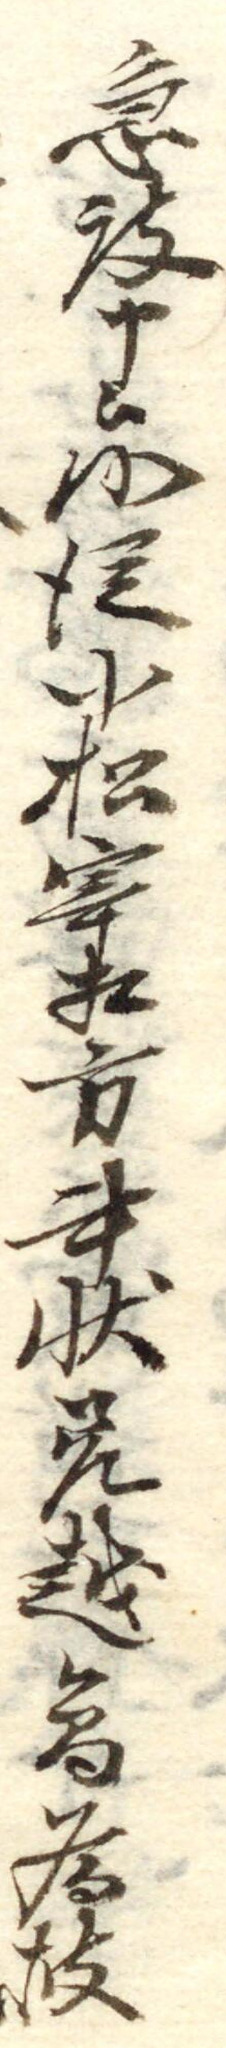急度申候御従小松宰相方書状差越候間為披
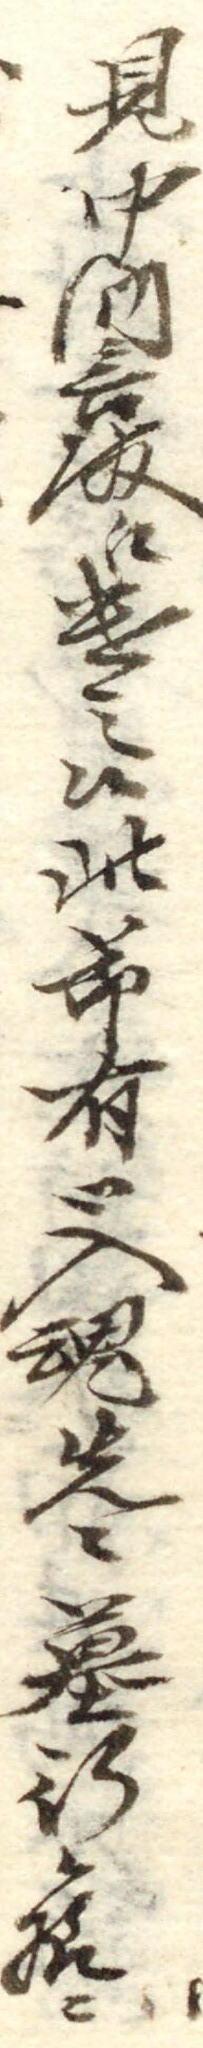見中納言殿江遣之候此節有御入魂先に墓行候様に
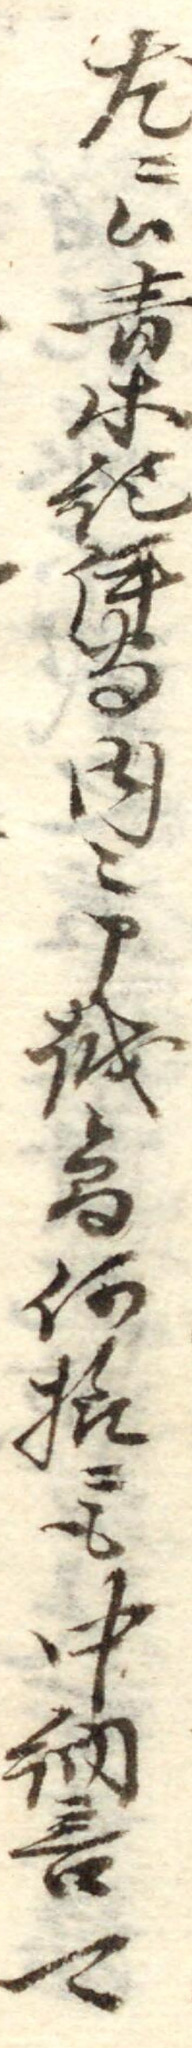尤に候青木紀伊守内々申越候間何様にも中納言可
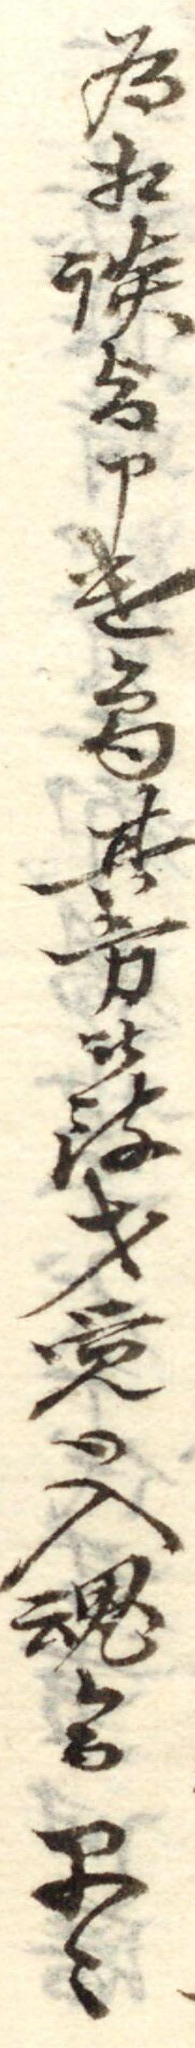為相談旨申遣候間其方被致才覚御入魂候而早々
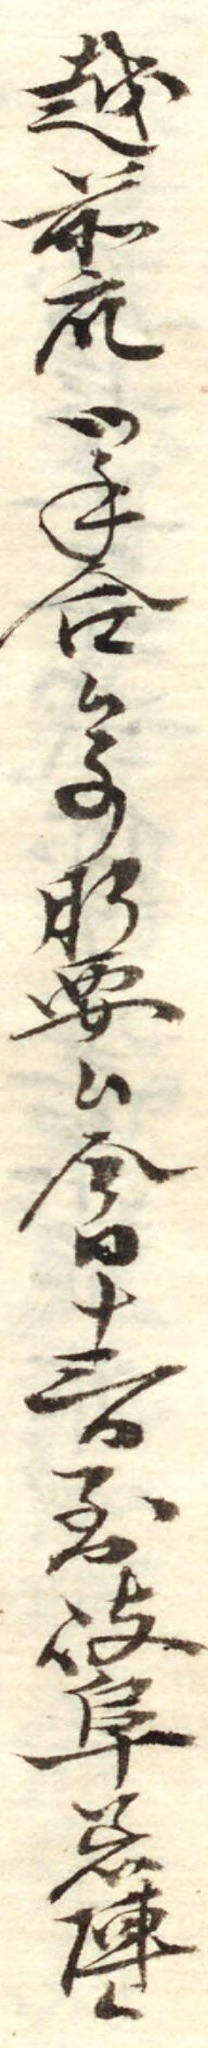越前衆御手合候事肝要候今日十三日至岐阜着陣候
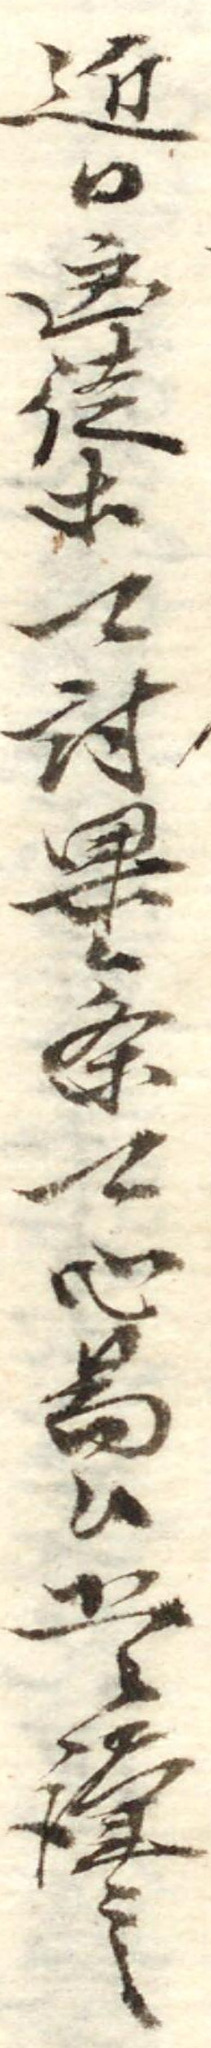近日凶徒等可討果候条可心易候恐々謹言
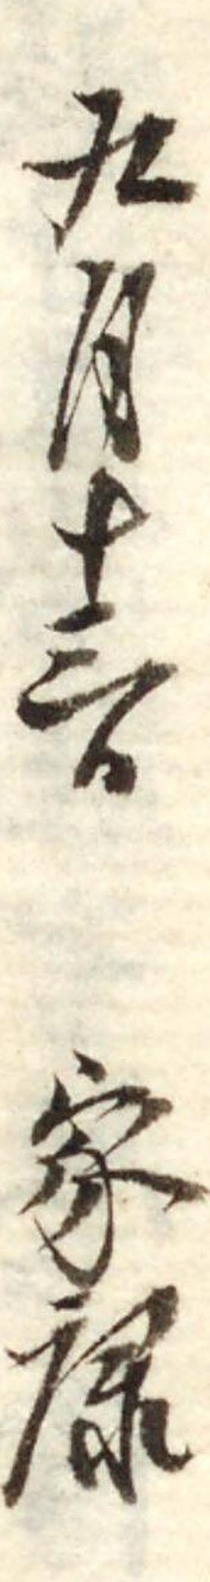九月十三日家康
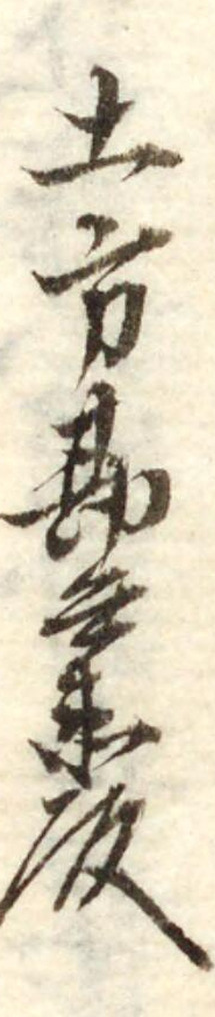土方勘兵衛殿
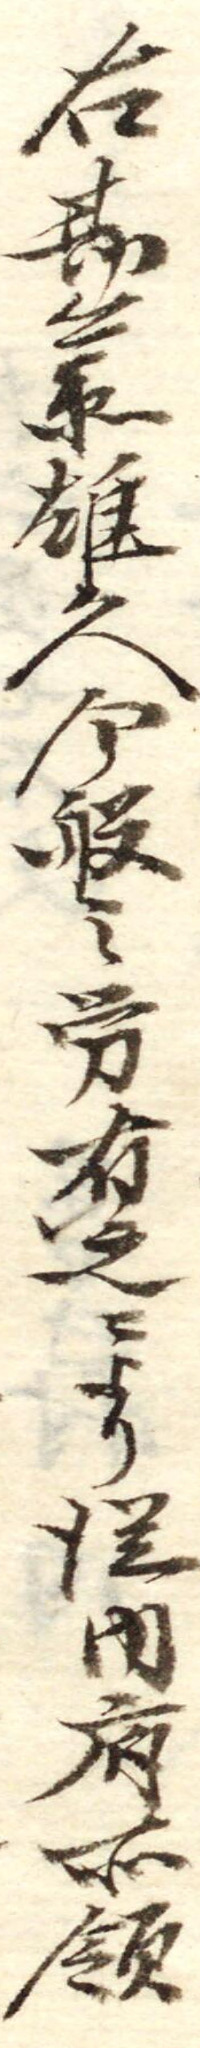右勘兵衛雄久今般之労有之により従内府所領
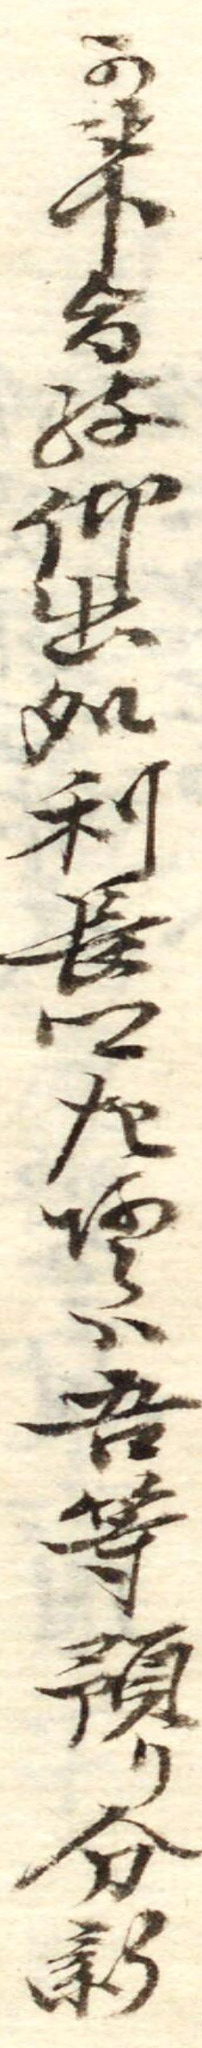可被下旨被仰出処利長郷左阿らは吾等預り分新
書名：前田家封国証書集録
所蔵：Ishikawa Prefectural Library
